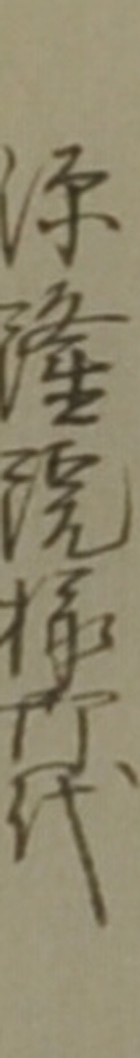源隆院様御代
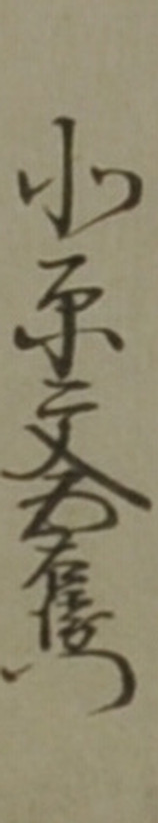北原儀右衛門
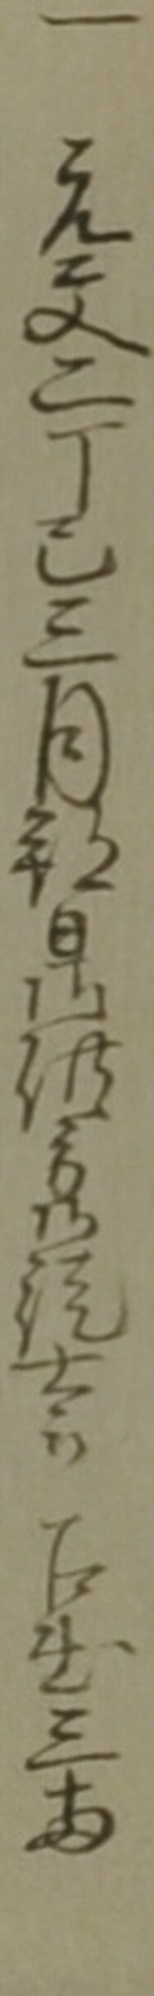一元文二丁巳三月朔日御供方御徒士被召出三両
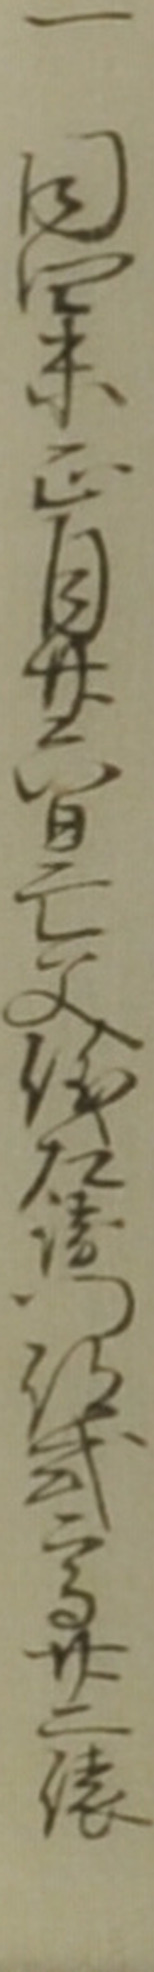一同四未正月廿六日亡父儀左衛門役式高弐拾弐俵
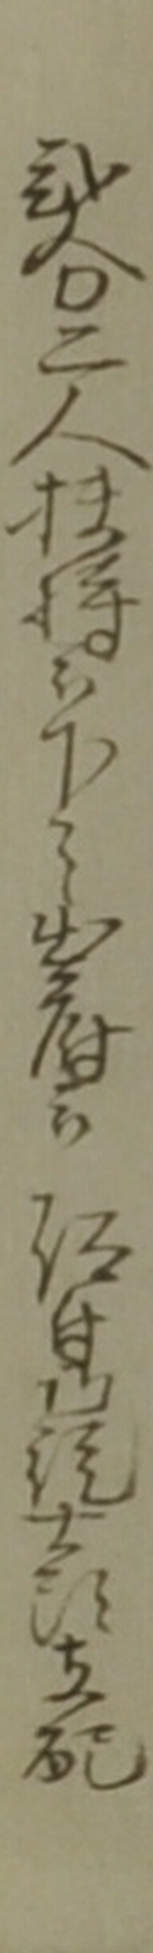弐分二人扶持被下候出府被仰付御徒士頭支配
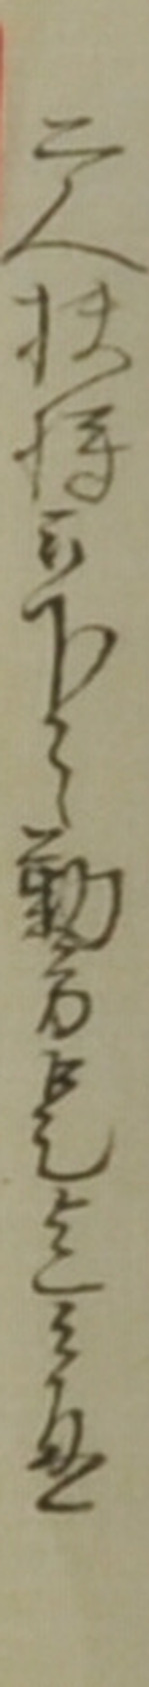二人扶持被下候勤方是迄之通

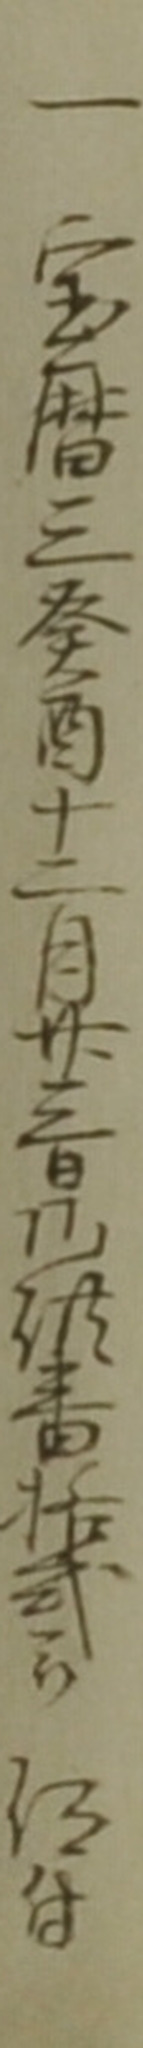一宝暦三癸酉十二月廿三日御供番格式被仰付
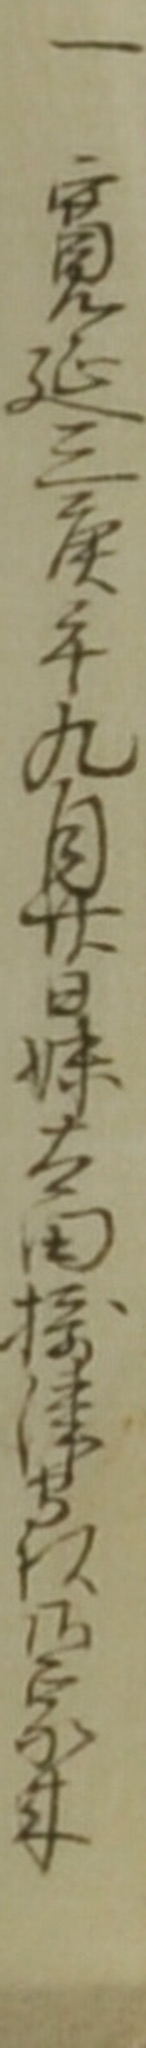一寛延三庚午九月廿日妹太田摂津守様御家来
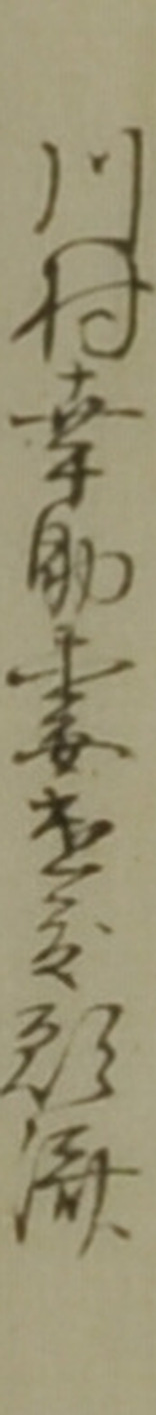川村幸助妻遣度願済
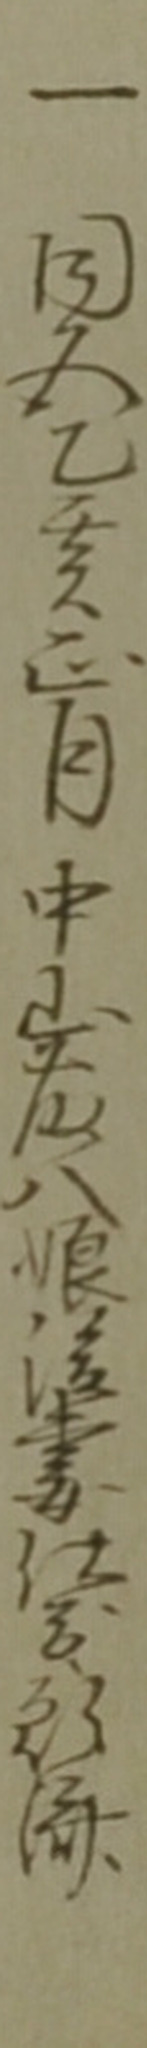一同五乙亥正月中山藤八娘後妻仕度願済
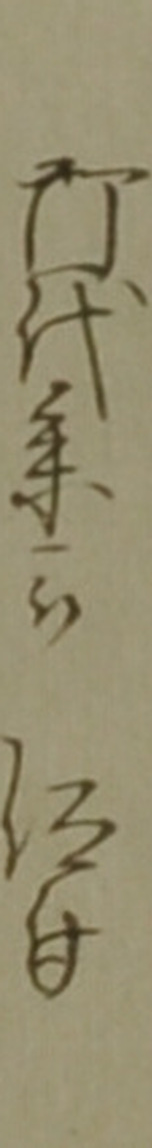御代参被仰付
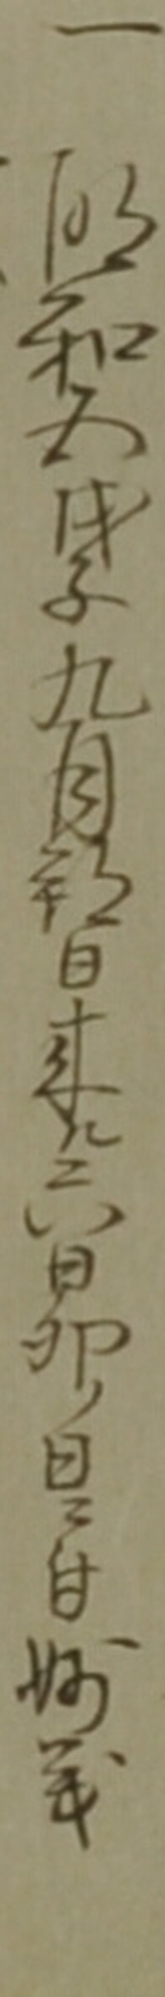一明和五戊子九月朔日来ル六日卯ノ日二付妙義
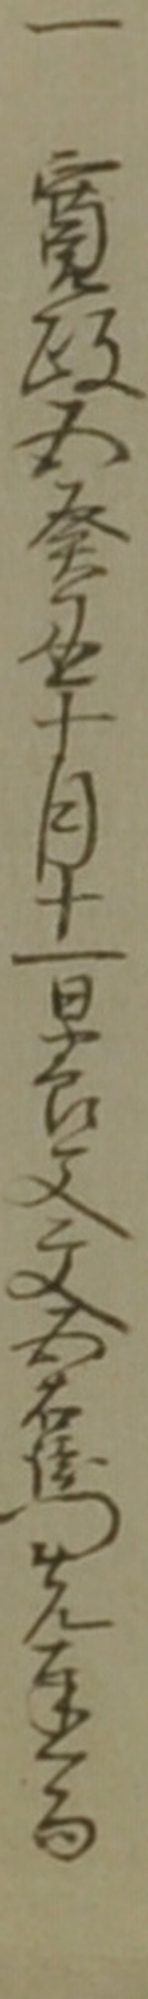一寛政五癸丑十月十一日養父文五右衛門先達而
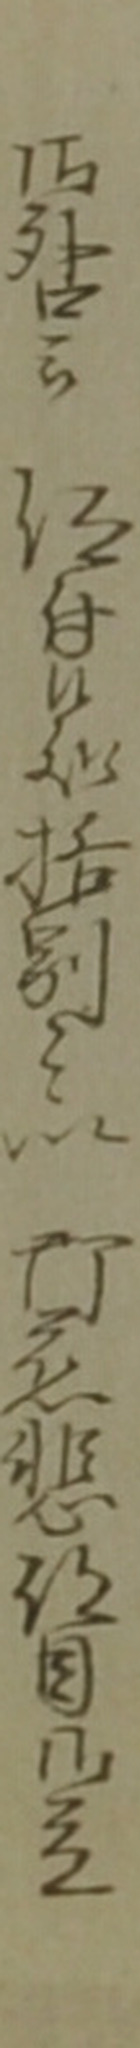御咎被仰付候処格別之以御慈悲役目御立
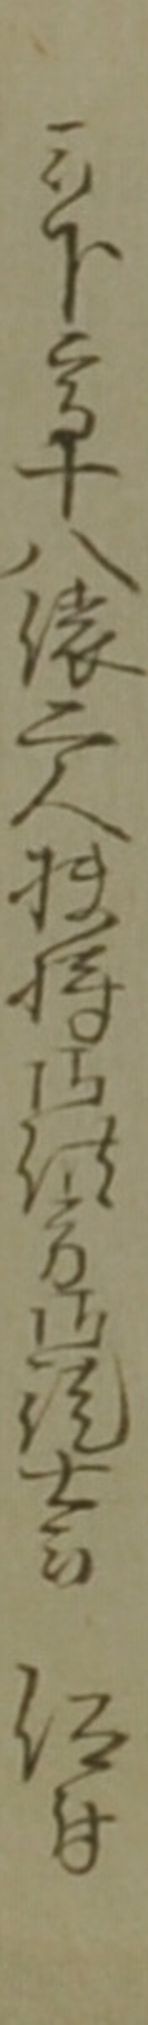被下高十八俵二人扶持御供方御徒士被仰付
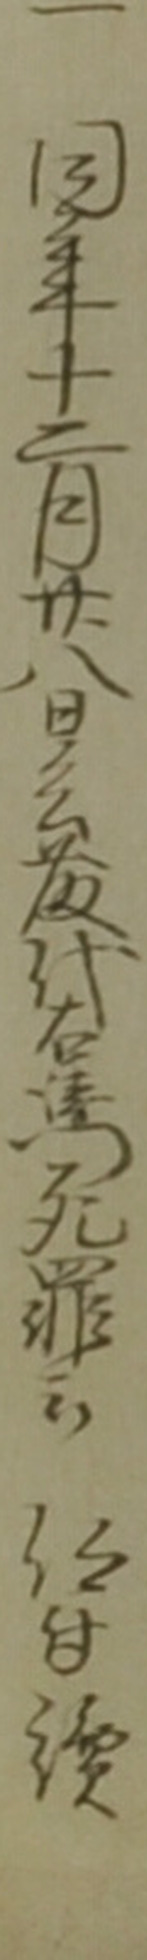一同年十二月廿八日兵藤代右衛門死罪被仰付続
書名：無足諸士勤仕録（六）
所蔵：伊那市立高遠町図書館・合同会社AMANE
